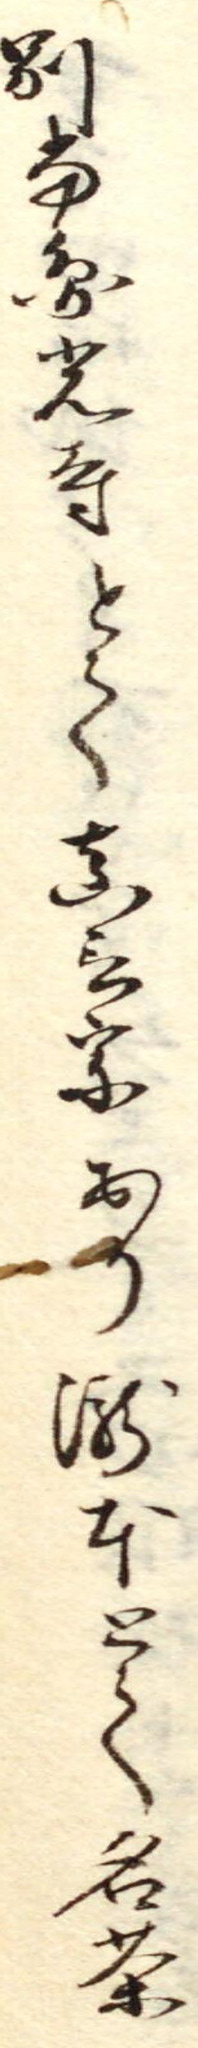別当圓光寺とて真言宗あり瀧本とて名茶
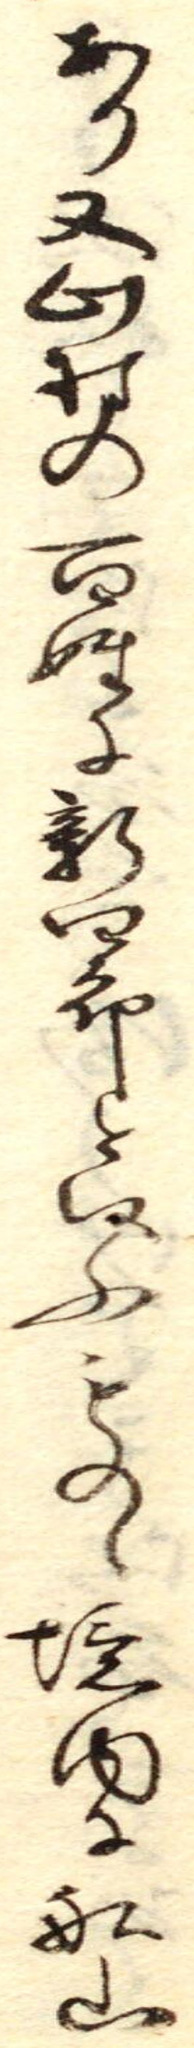あり又此村の百姓に新四郎といふもの境内に船山
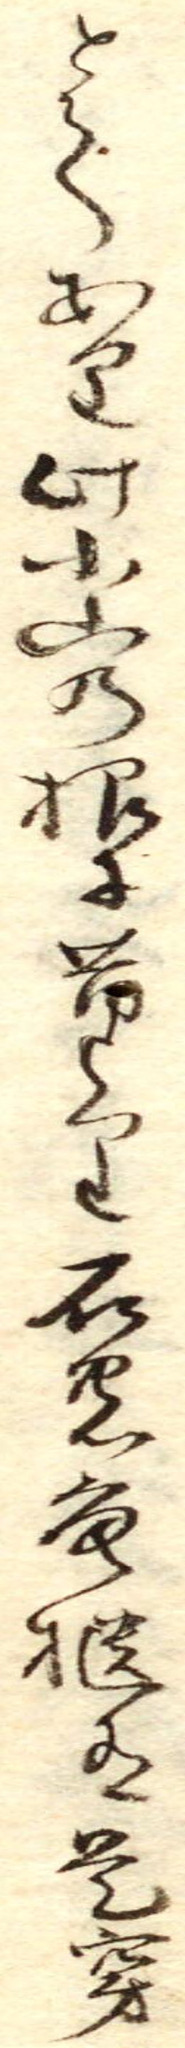とてあり此小山の根に昔より石の唐櫃有是穿
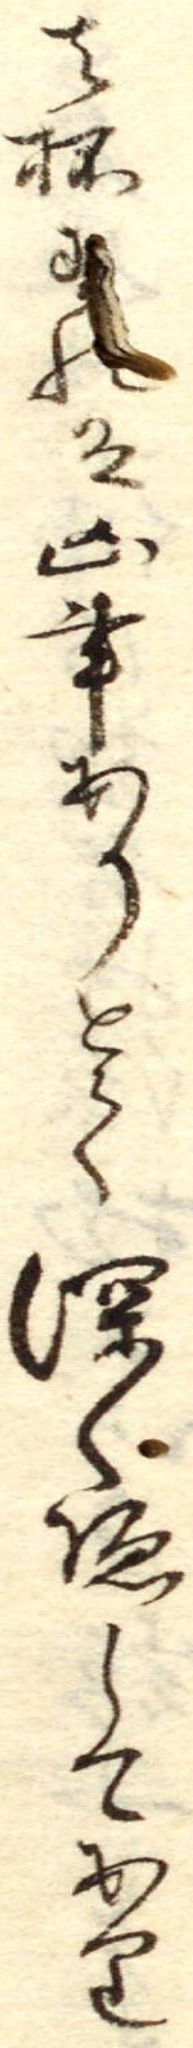者抔すれは凶事ありとて深く隠してあり
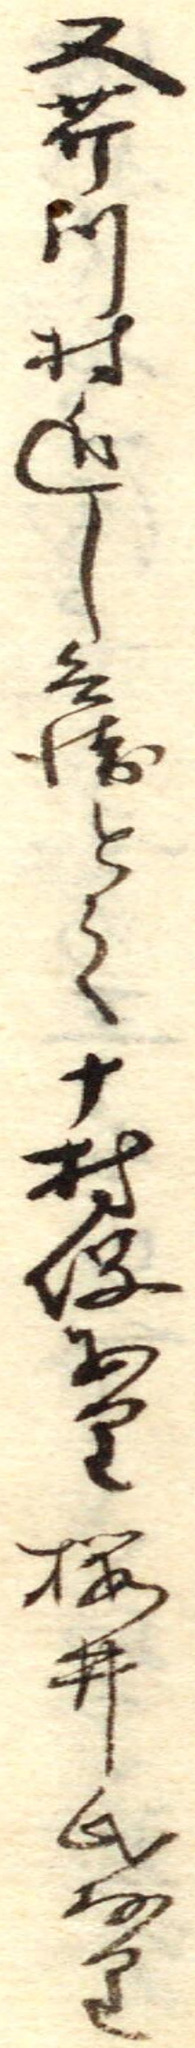又芹川村近し兵衛とて十村役あり桜井氏なり
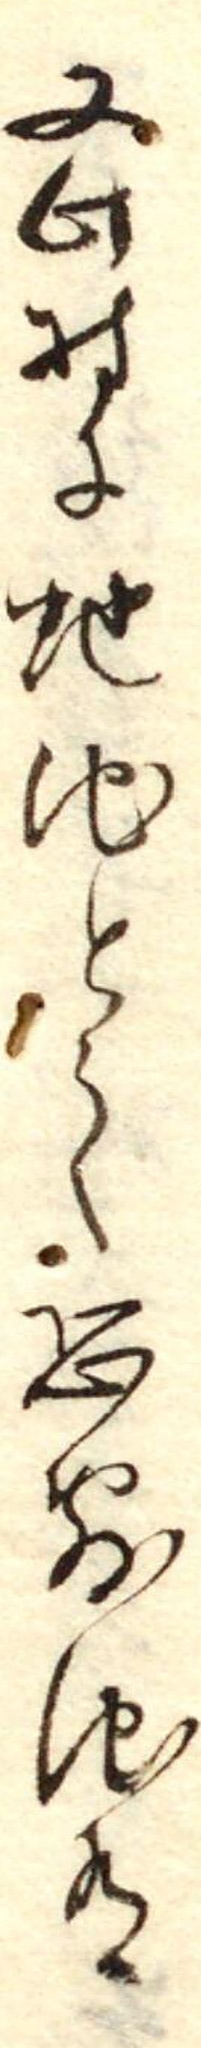又此村に蛇池とて恐敷池有
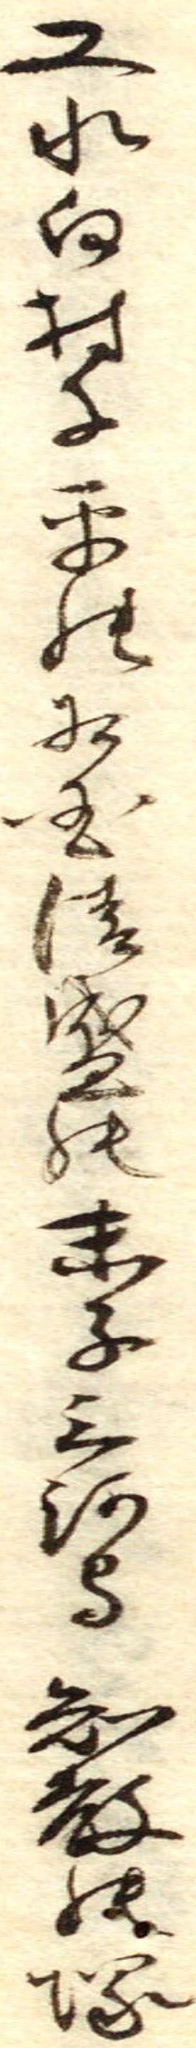又水白村に平の相国清盛の末子三河守知教の塚
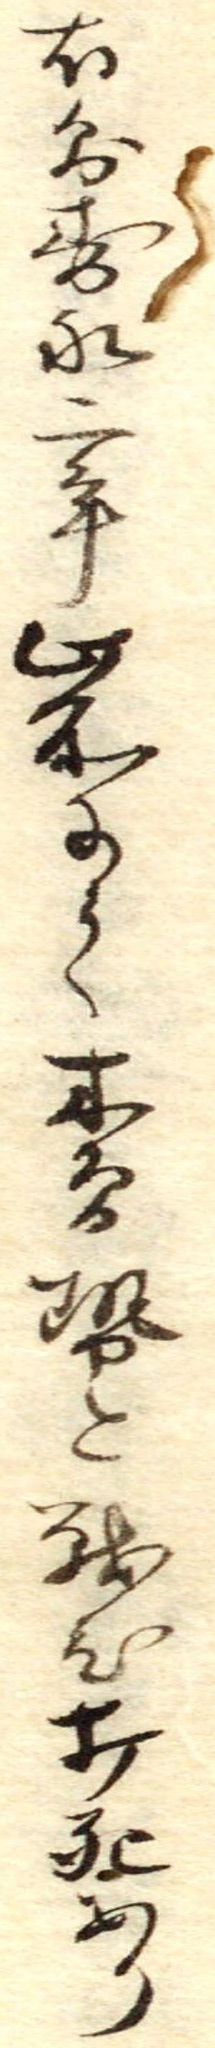有則寿永二年此所にて木曾勢と戦ひ打死あり
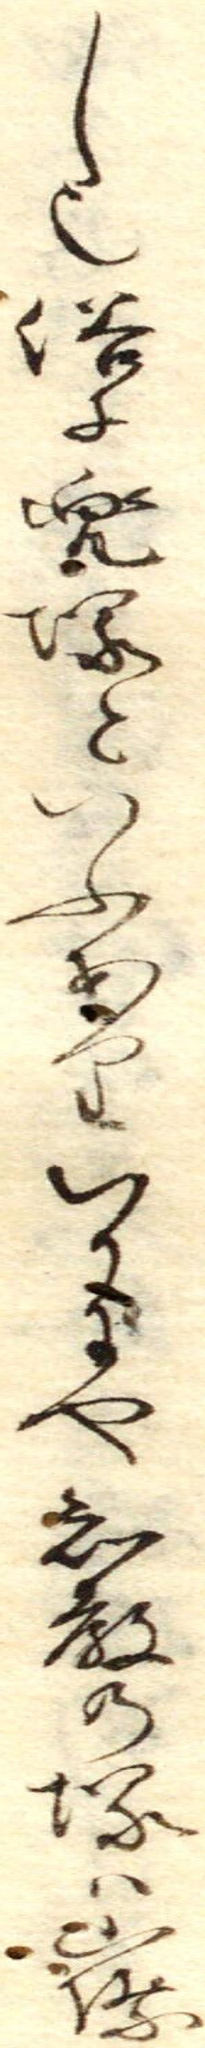し也俗に兜塚といふありいかにや知教の塚は山際
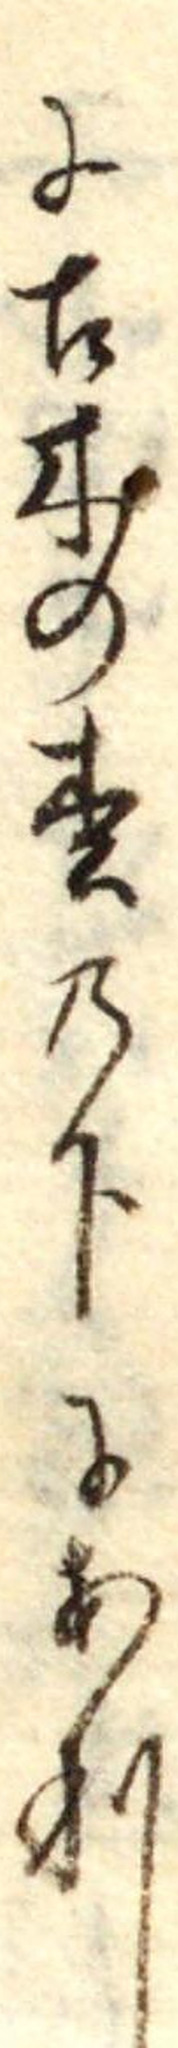に古木の枩の下にあり

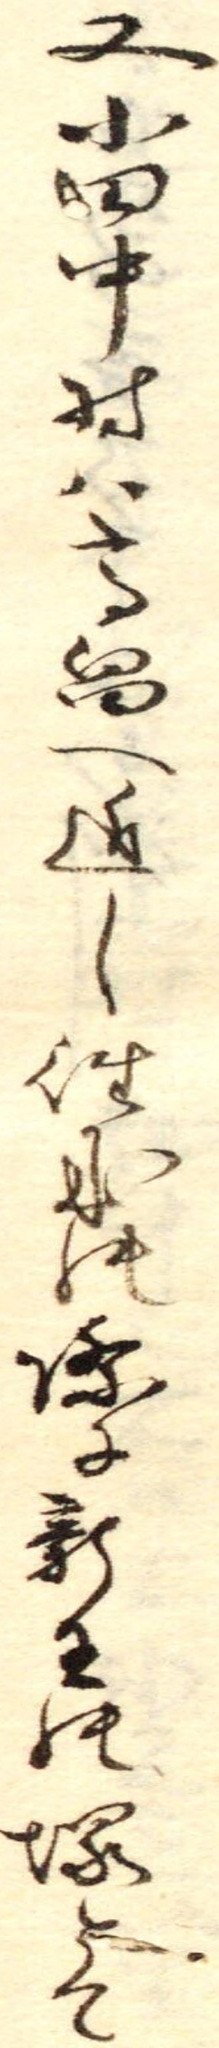又小田中村は高畠へ近し往来の際に新王の塚とて
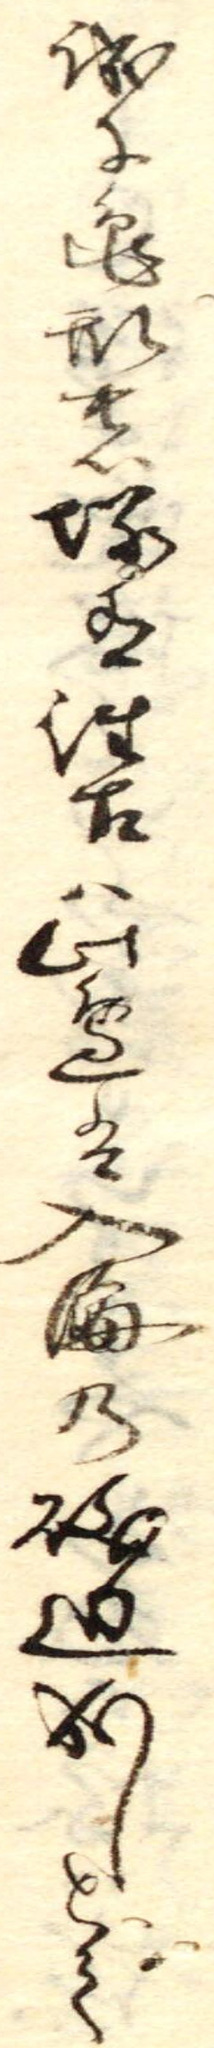誠に亀形の塚有往古は此辺は入海の礒辺成しとて
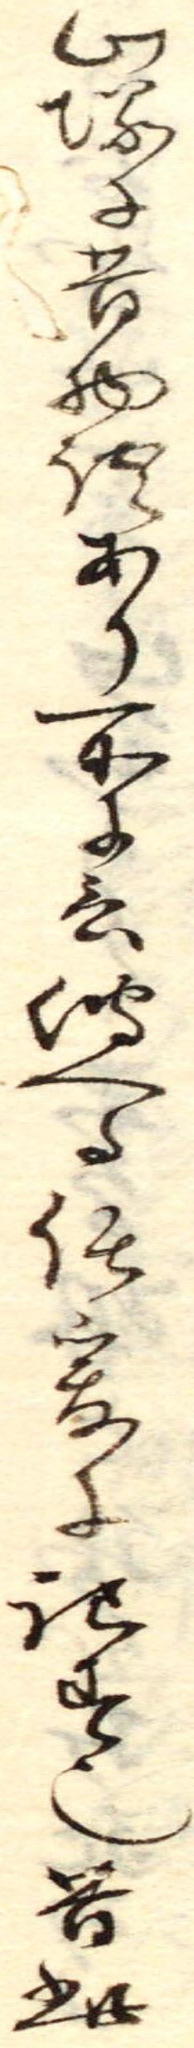此塚に昔物語あり所に云伝へる任爰に記す也昔此
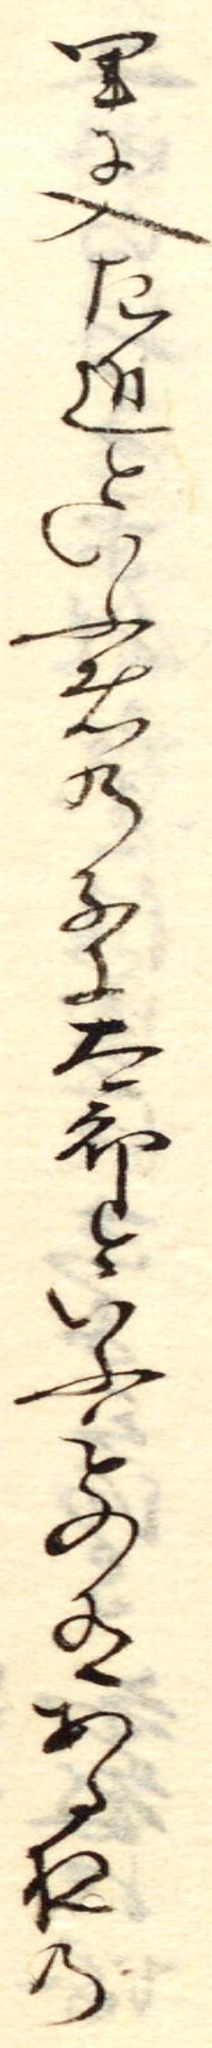里に入左近といふ者の子に太郎といふもの有ある夜の
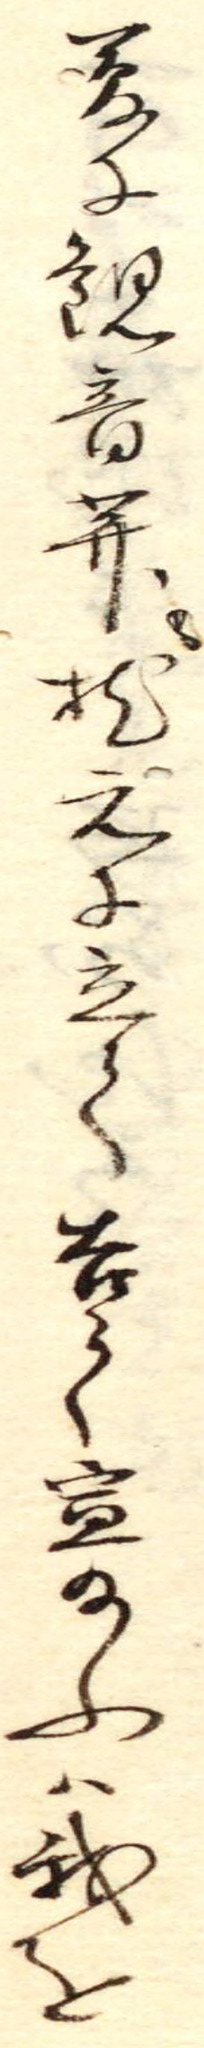夢に観音菩薩枕元に立て告て宣給ふは我を
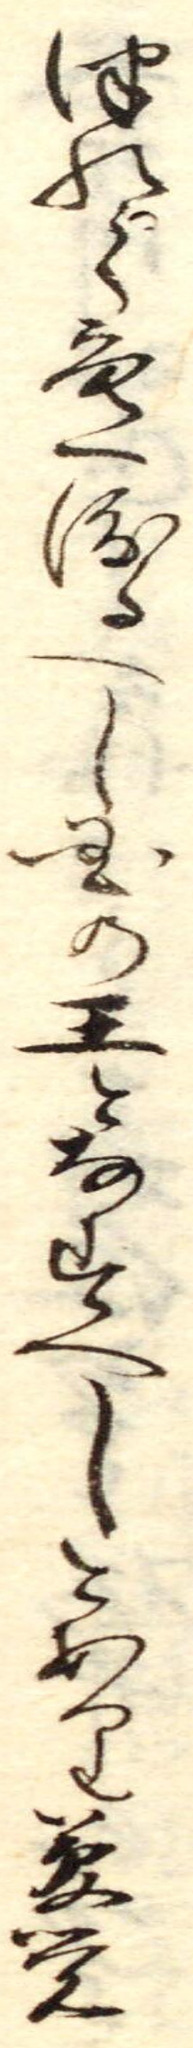つれて唐へ渡るへし国の王となすへしとあり夢覚
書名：能登名跡誌
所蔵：Ishikawa Prefectural Library
